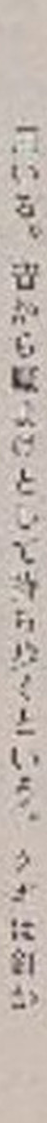用いる。昔から魔よけとして持ち歩くという。クギは釘か
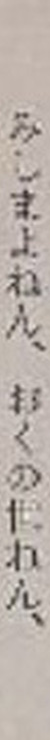みしまよねん、おくの世ねん、
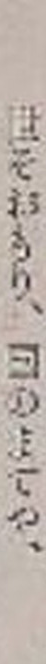世そおもり、国のまてや、
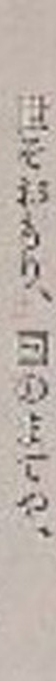世そおもり、国のまてや、
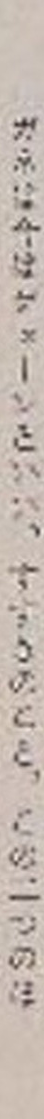ガネは今はゲェーンといい、すすきのこと。この二つのほ
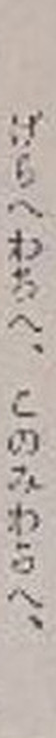げらへわちへ、このみわちへ、
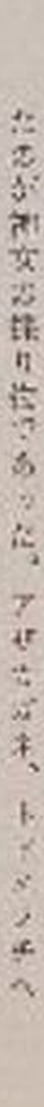たのが神女の繰り物であった。アザカガネ、トドメワチヘ
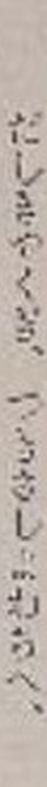だしきやくぎ、つきさしよわちへ、
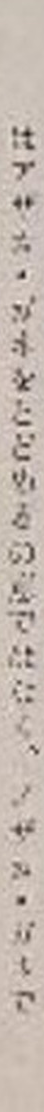はアザカ・ガネをとどめるの意ではなく、アザカ・ガネで
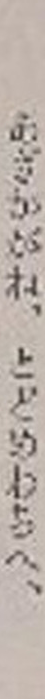あざかがね、とどめわちへ、
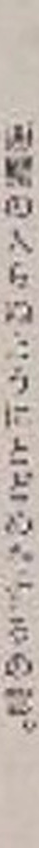悪魔の入らぬようにとどめをするの意。
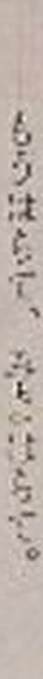もうはらて、みをはらて。
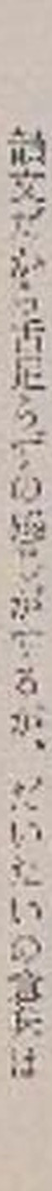韻文だから舌足らずの感じがするが、だいたいの意味は
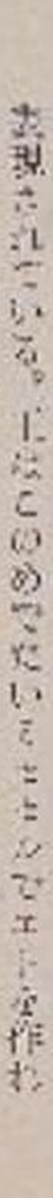表現されている。王はこのめでたいミセセルでエトを作れ
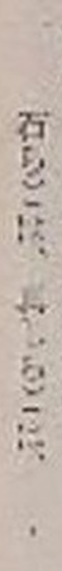石らごは、真しらごは、
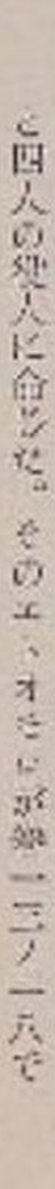と四人の役人に命じた。そのエトオモロが巻一三ノ一八で
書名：沖縄口承文芸
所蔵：University of the Ryukyus Library
